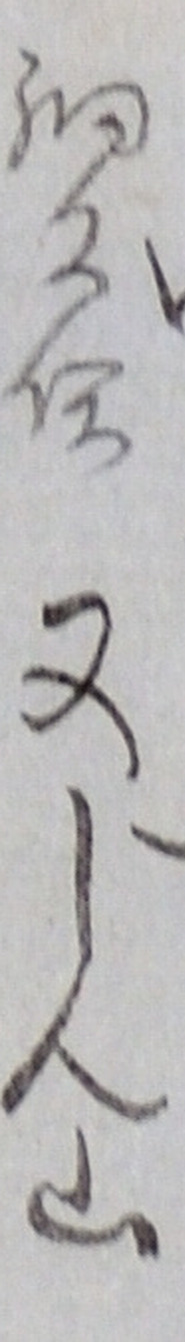洞久保又しん山
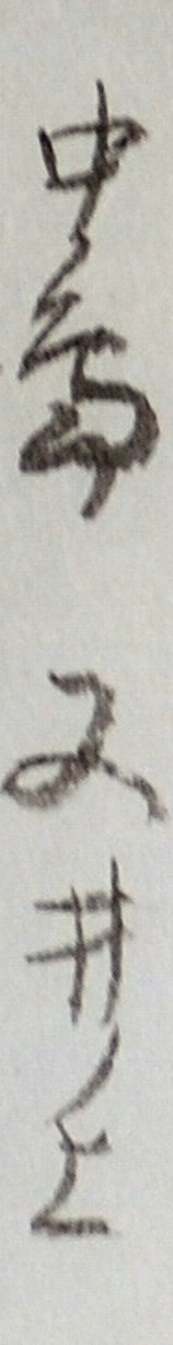中島又日向
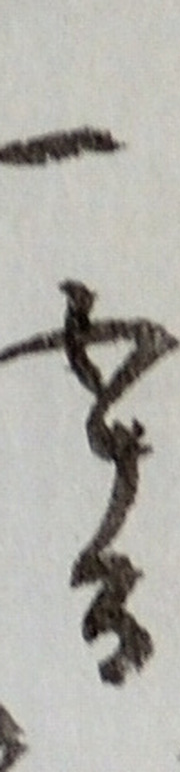一五十間
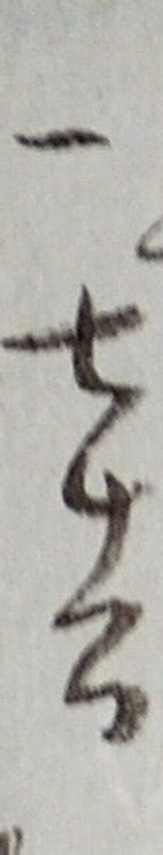一七十間
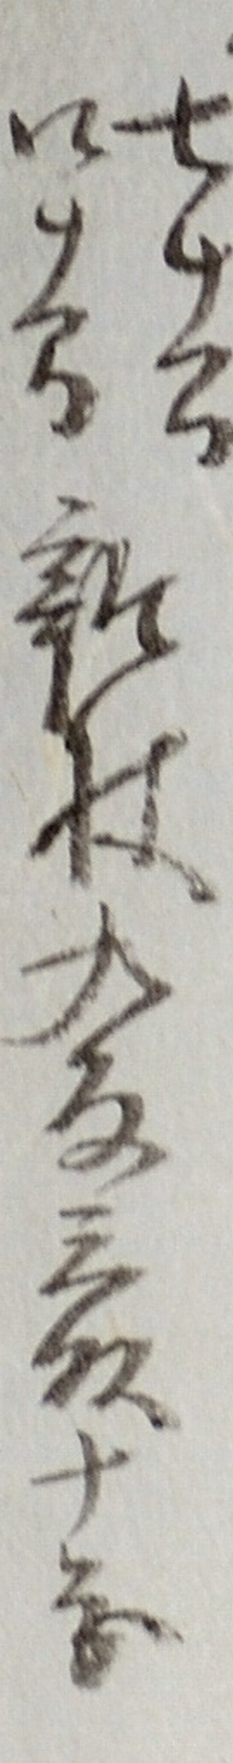四十間雑林九反三畝十歩
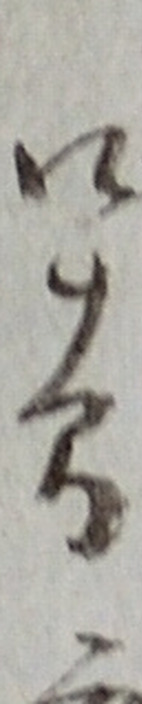四十間
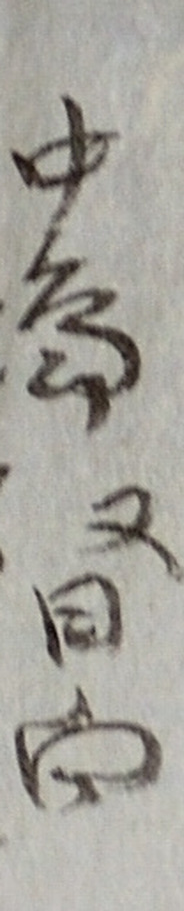中島又日向
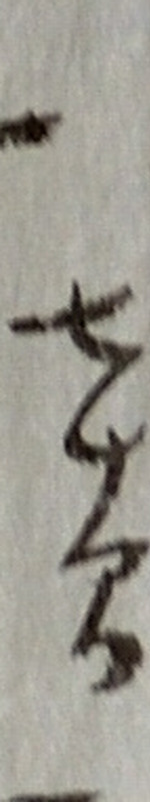一七十間
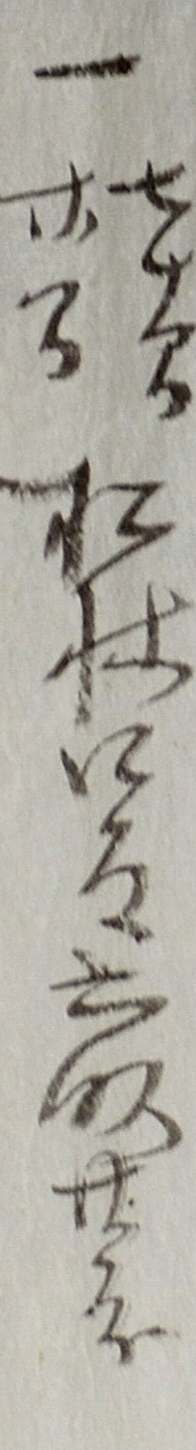廿間松林四反六畝廿歩
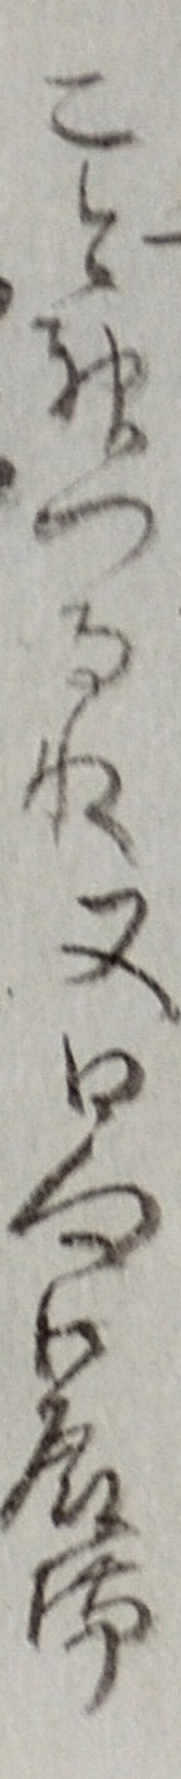こと神つるね又日向御場
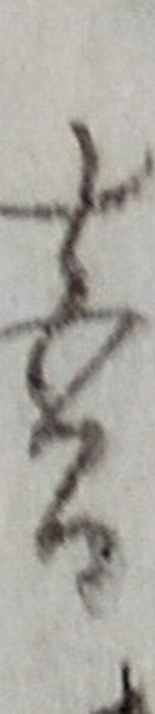十五間
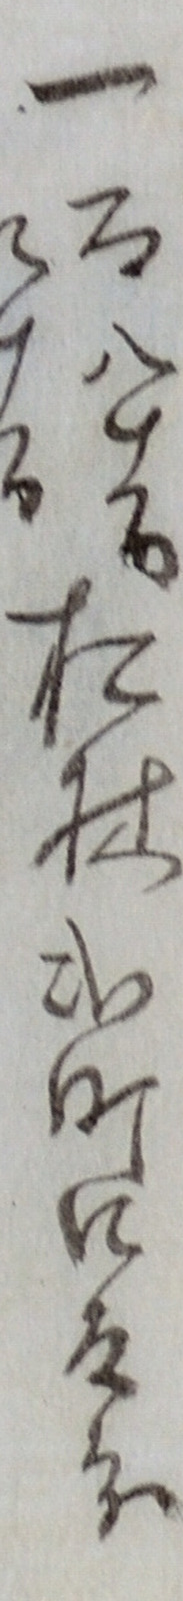一百八十間松林弐町四反歩
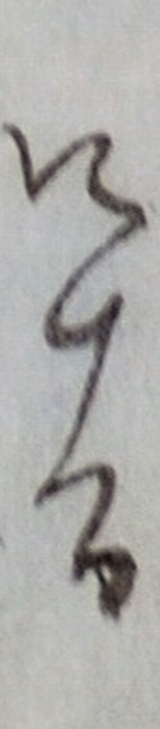四十間

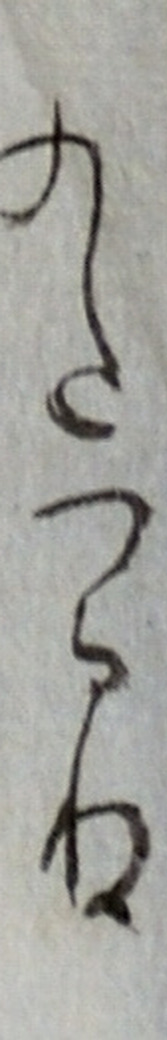入たつるね
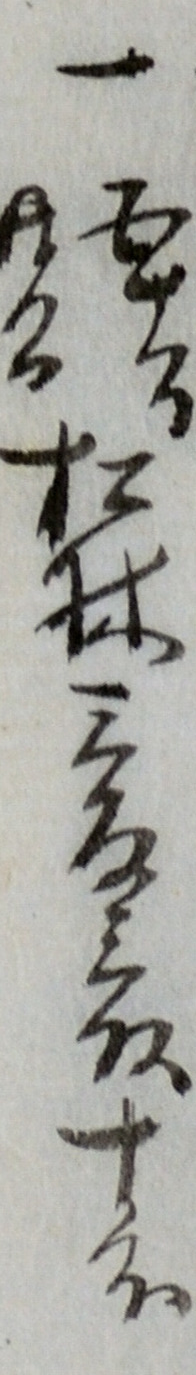一五十間松林三反三畝十歩
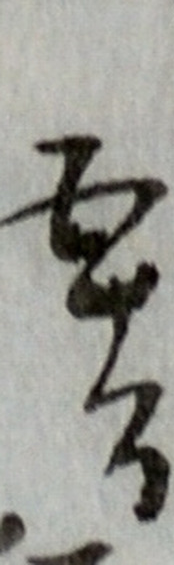五十間
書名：中澤郷御林控
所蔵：伊那市立高遠町図書館・合同会社AMANE
